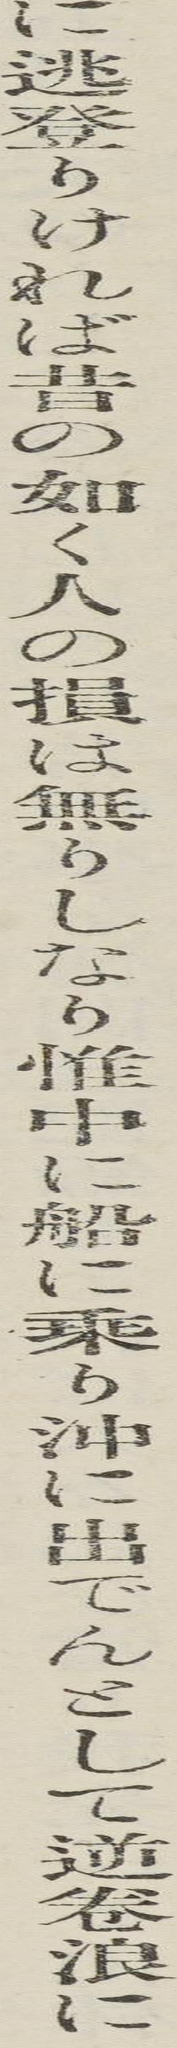に逃登りければ昔の如く人の損は無りしなり惟中に船に乗り沖に出でんとして逆巻浪に
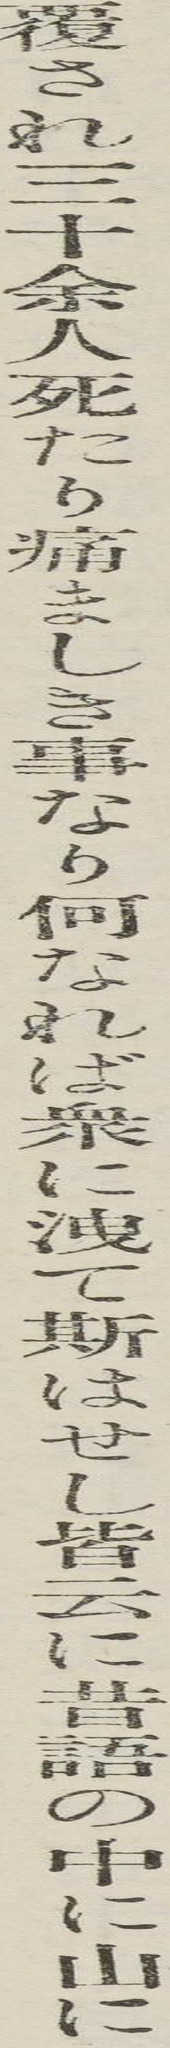覆され三十余人死たり痛ましき事なり何なれば衆に洩て斯はせし皆云に昔語の中に山に
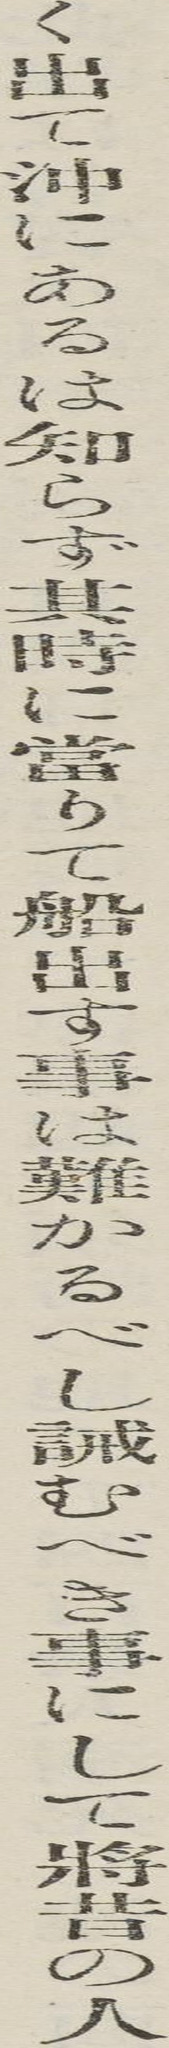く出て沖にあるは知らず其時に当りて船出す事は難かるべし誡むべき事にして将昔の人
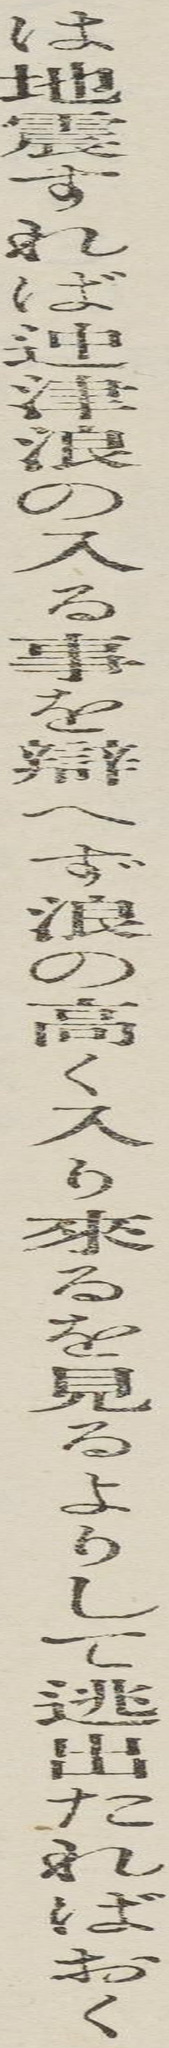は地震すれば迚津浪の入る事を弁へず浪の高く入り来るを見るよりして逃出たればおく
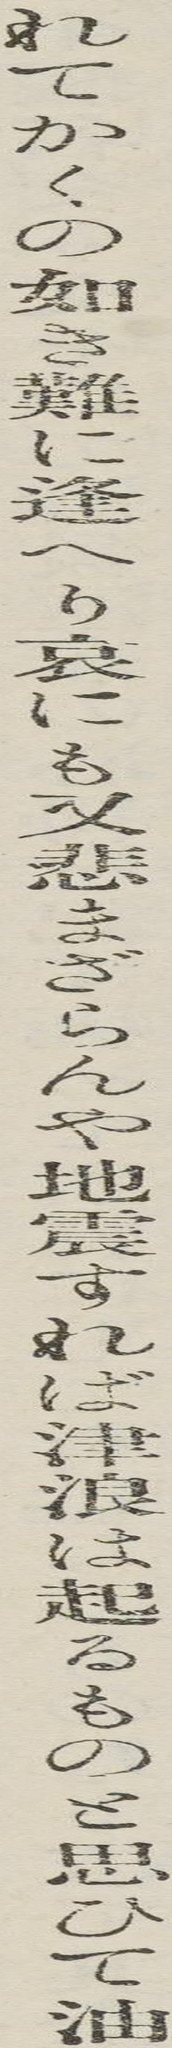れてかくの如き難に逢へり哀にも又悲まざらんや地震すれば津浪は起るものと思ひて油
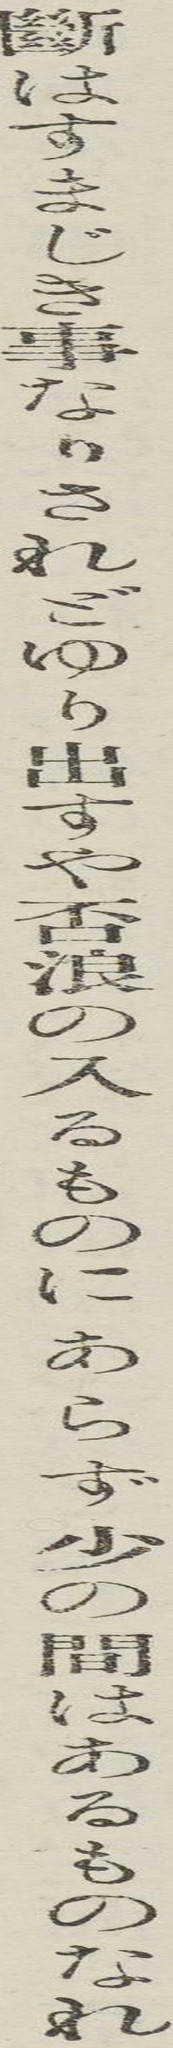断はすまじき事なりされどゆり出すや否浪の入るものにあらず少の間はあるものなれ
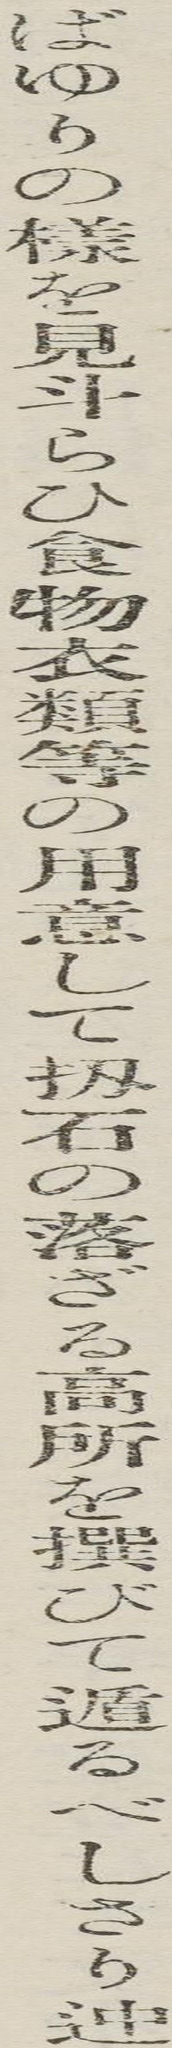ばゆりの様を見斗らひ食物衣類等の用意して扨石の落ざる高所を撰びて遁るべしさり迚
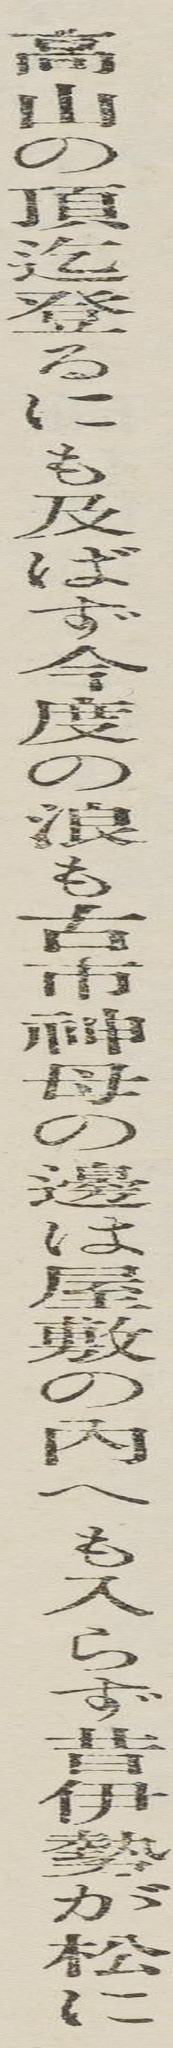高山の頂迄登るにも及ばず今度の浪も古市神母の辺は屋敷の内へも入らず昔伊勢が松に
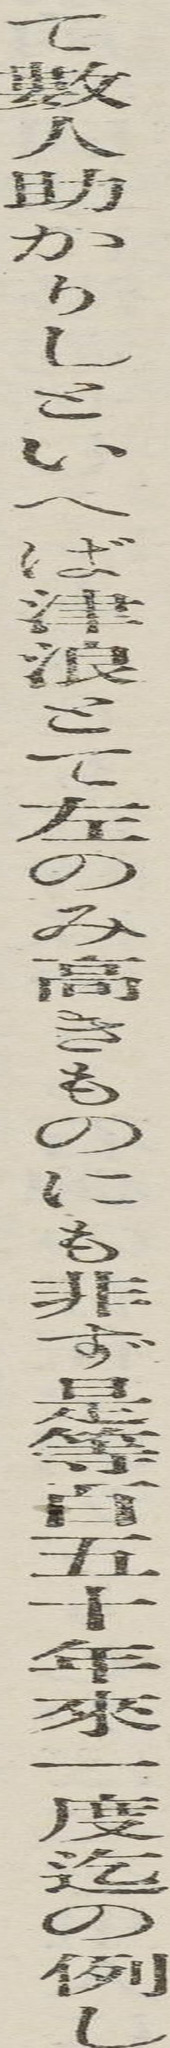て数人助かりしといへば津浪とて左のみ高きものにも非ず是等百五十年来一度迄の例し
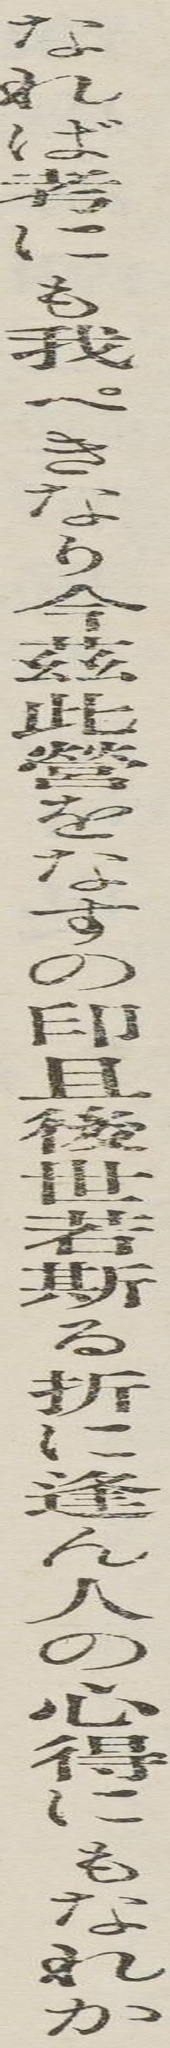なれば考にも我べきなり今茲此営をなすの印且後世若斯る折に逢ん人の心得にもなかれ
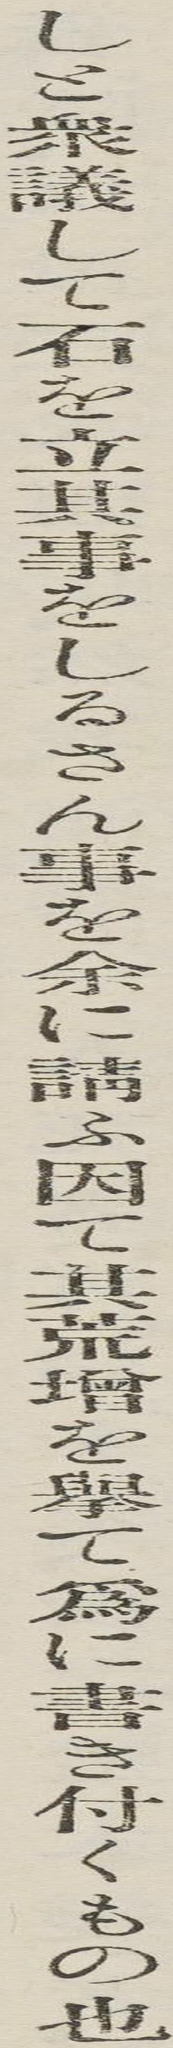しと衆議して石を立其事をしるさん事を余に請ふ因て其荒増を挙て為に書き付くもの也
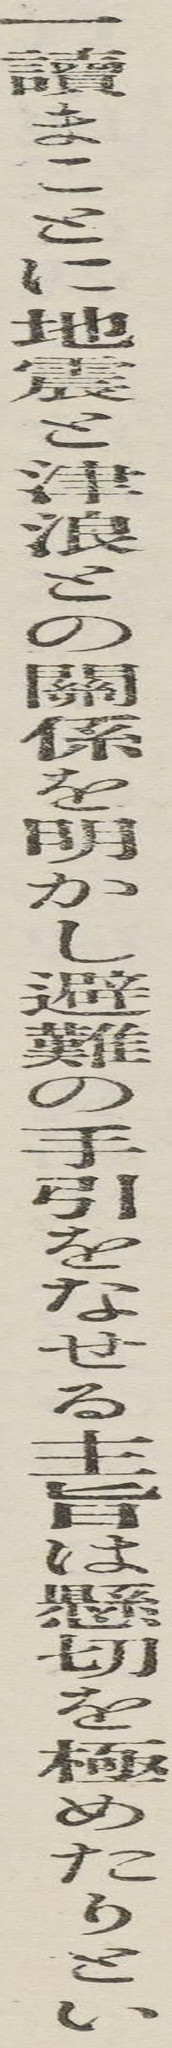一読まことに地震と津浪との関係を明かし避難の手引をなせる主旨は懸切を極めたりとい
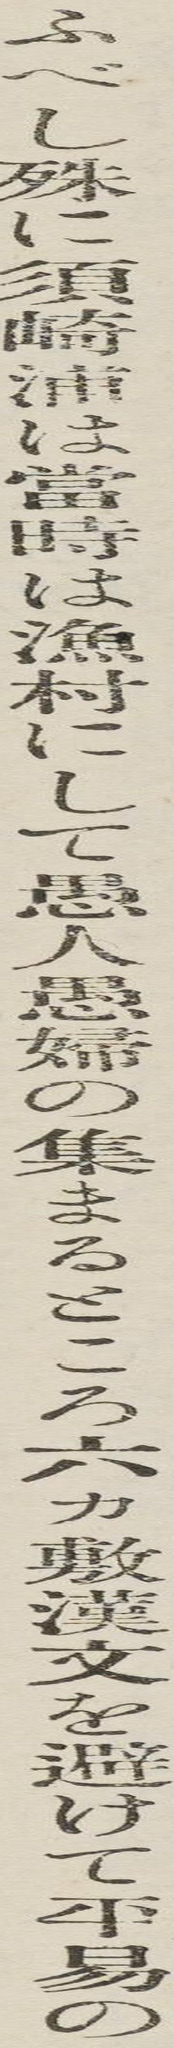ふべし殊に須崎浦は当時は漁村にして愚人愚婦の集まるところ六ヵ敷漢文を避けて平易の
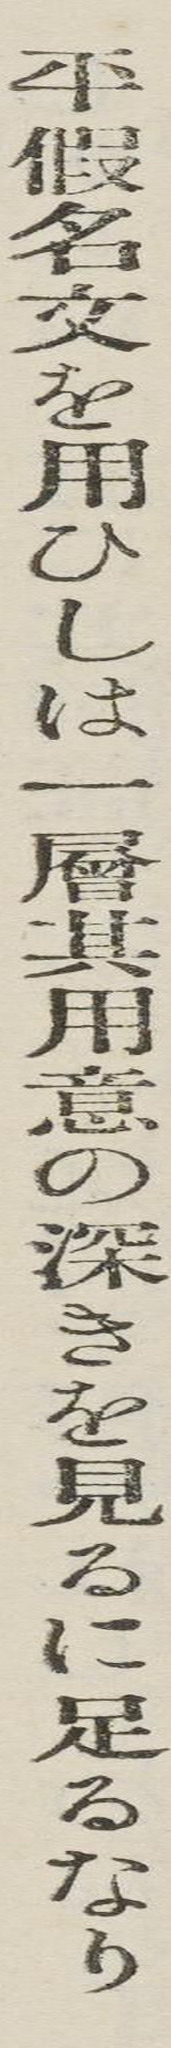平仮名文を用ひしは一層其用意の深きを見るに足るなり
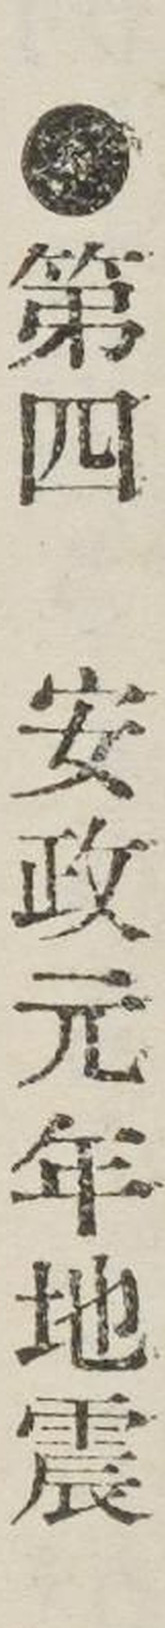●第四安政元年地震
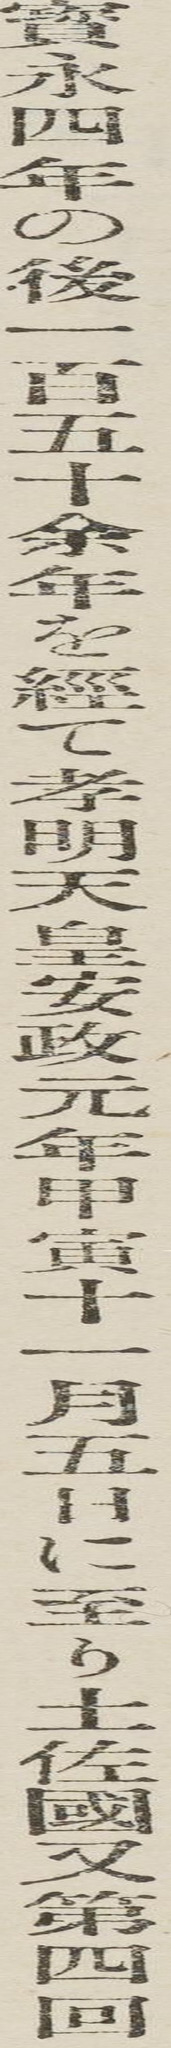宝永四年の後一百五十余年を経て孝明天皇安政元年甲寅十一月五日に至り土佐国又第四回
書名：土佐古今ノ地震
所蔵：東京大学地震研究所図書室 Earthquake Research Institute Library, The University of Tokyo, JAPAN
